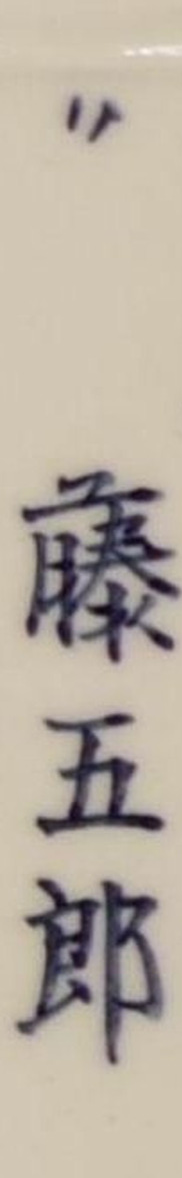藤五郎
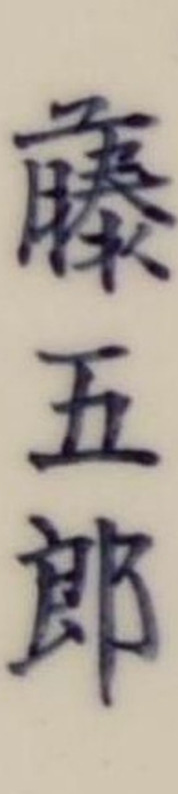藤五郎

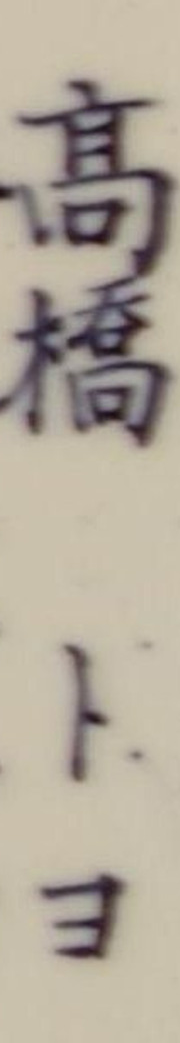高橋トヨ
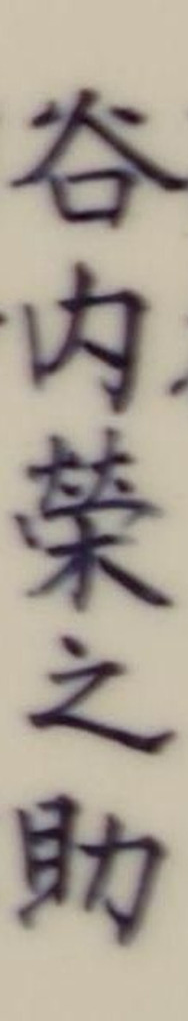谷内栄之助
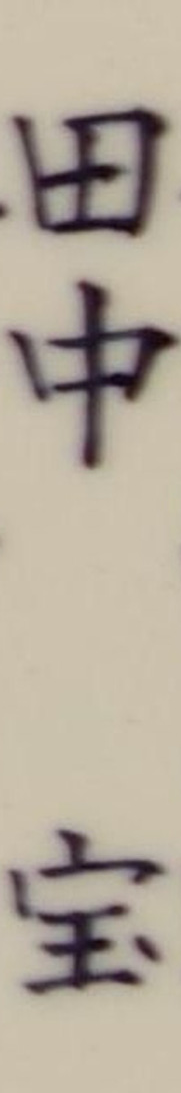田中宝
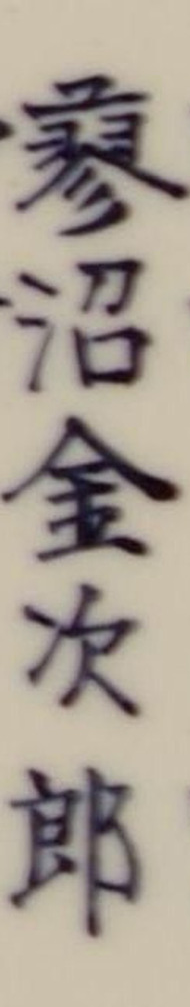蓼沼金次郎
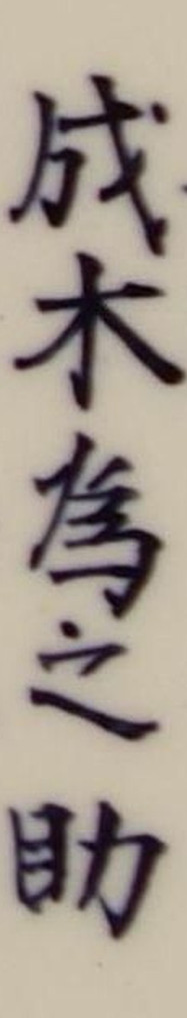成木為之助
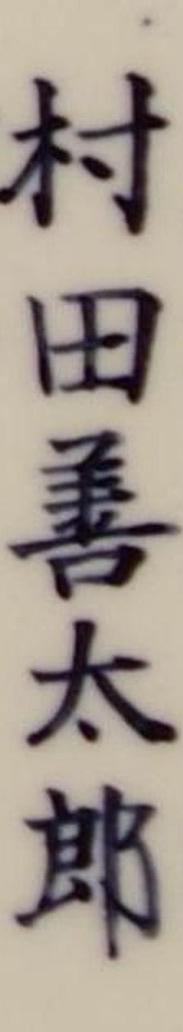村田善太郎
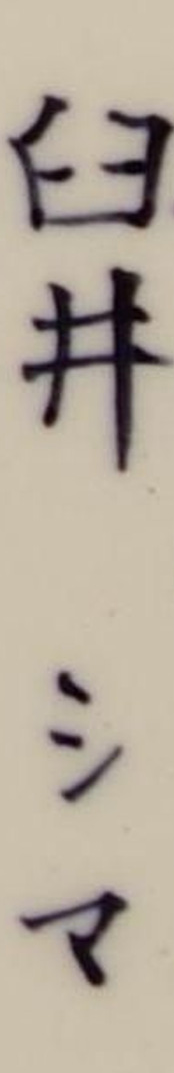臼井シマ
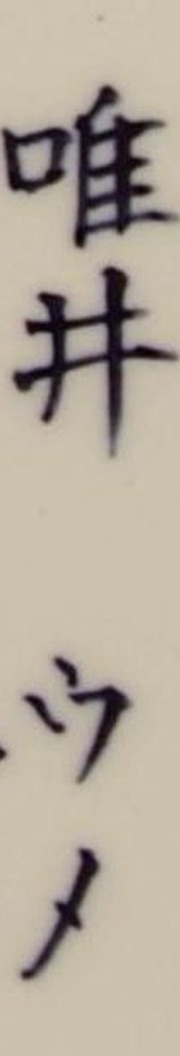唯井ウメ
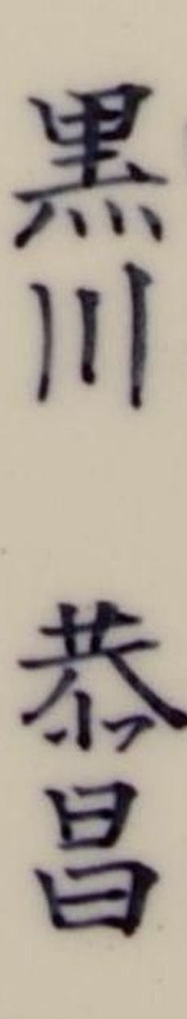黒川恭昌
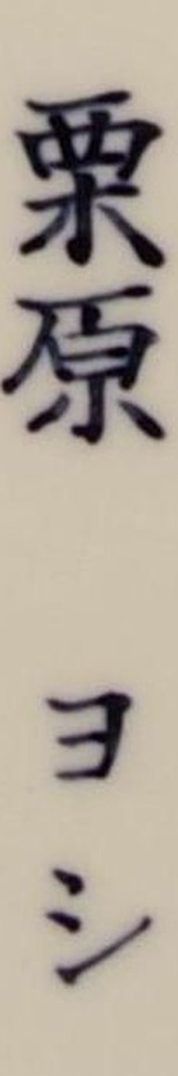栗原ヨシ
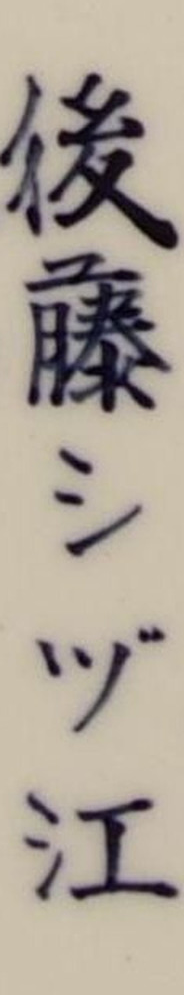後藤シヅ江
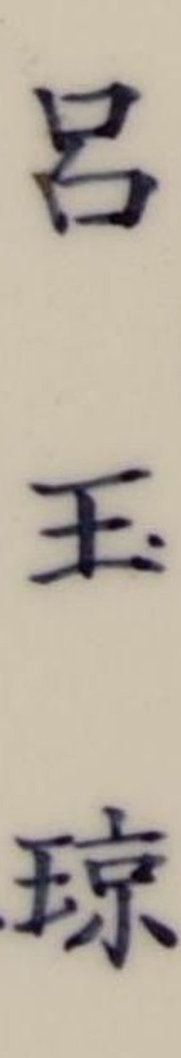呂玉掠
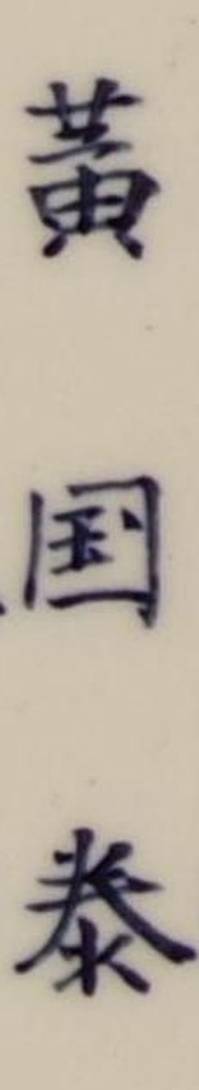黄国泰

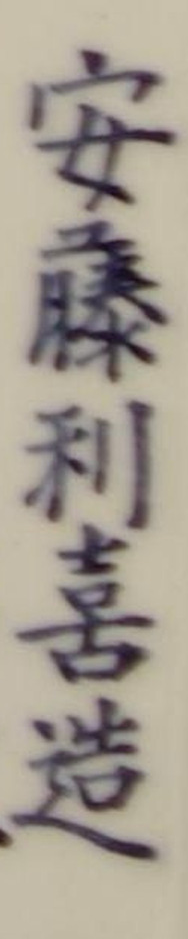安藤利喜造
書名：M~S
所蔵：高野山金剛峯寺
